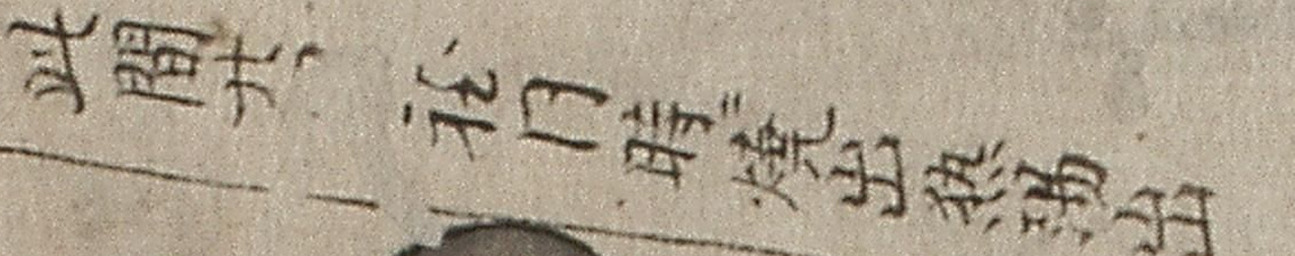此間廿程同時に焼出熱湯出
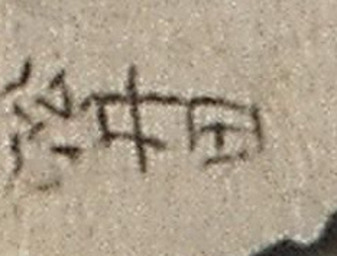松井田
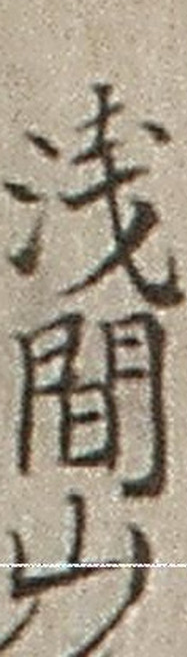浅間山

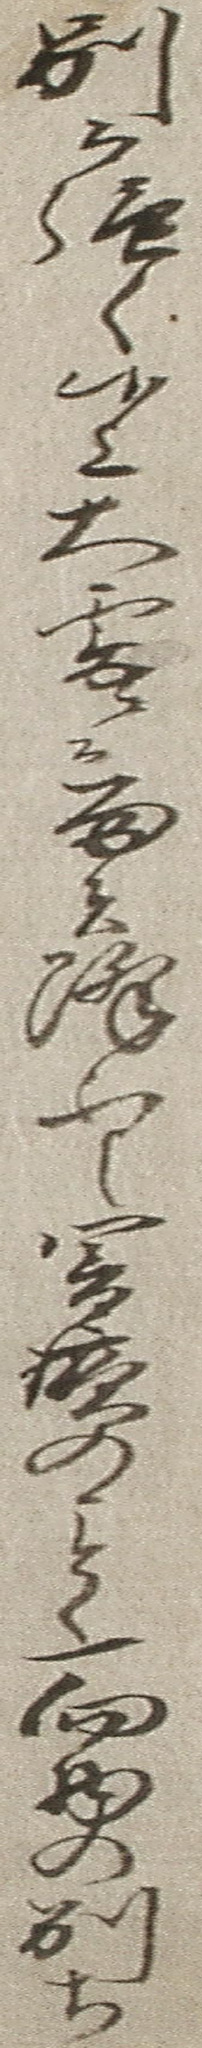別而強く候上大雷に而雨者降不申闇夜のことく一向物の別ち
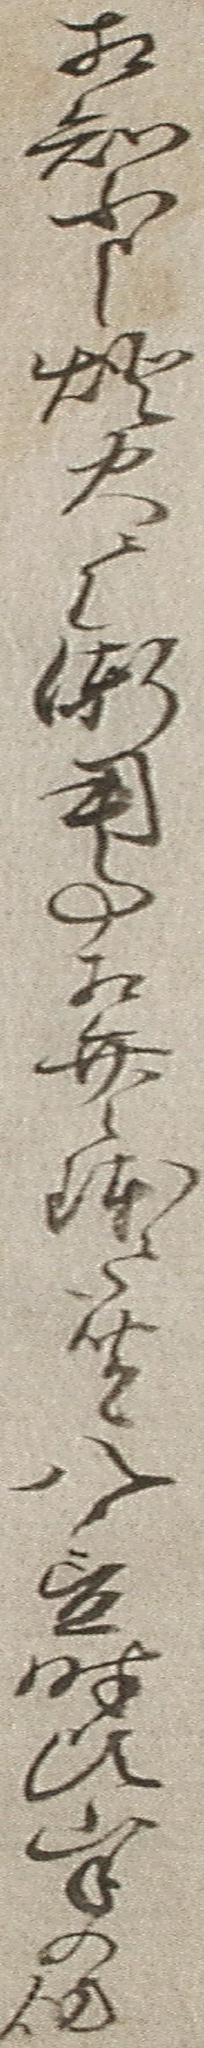相知不申燈火にて漸用事相弁候体に御座候八日昼時頃山手の方ゟ
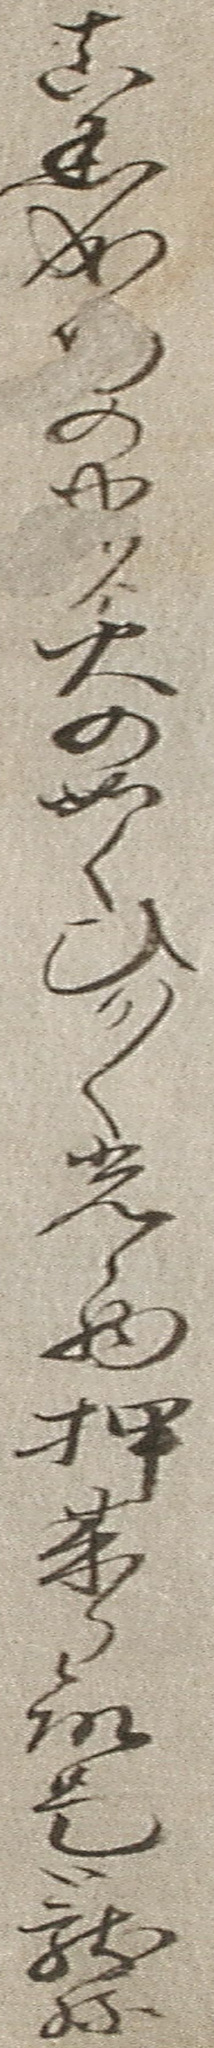真黒成川の中ゟ火の如くひか〳〵光候物押来り候故是は龍抔
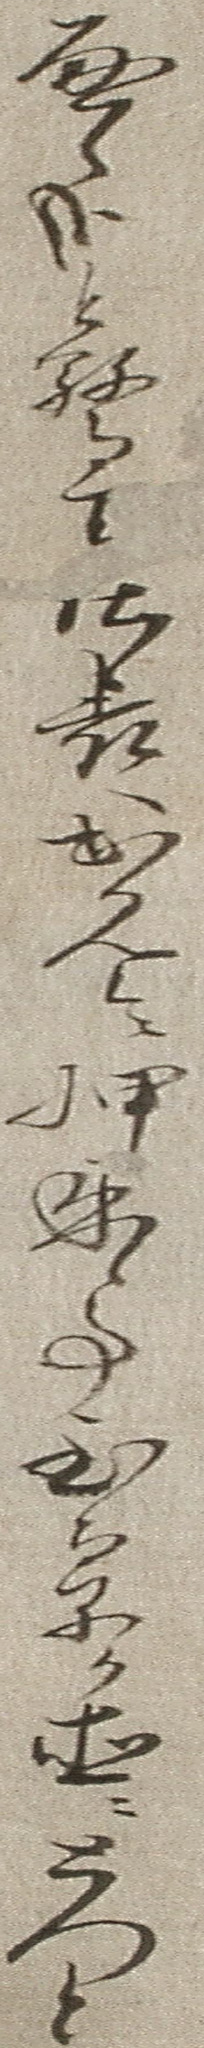通候哉と驚て表へ出見之に押来候事至而早く直にとつと
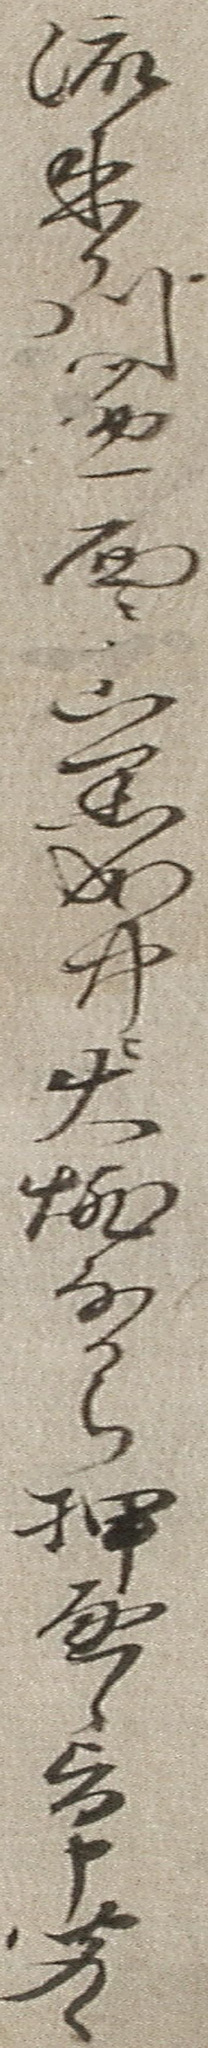流来り川筋一面に真黒成中に火燃なから押通候旨申聞候
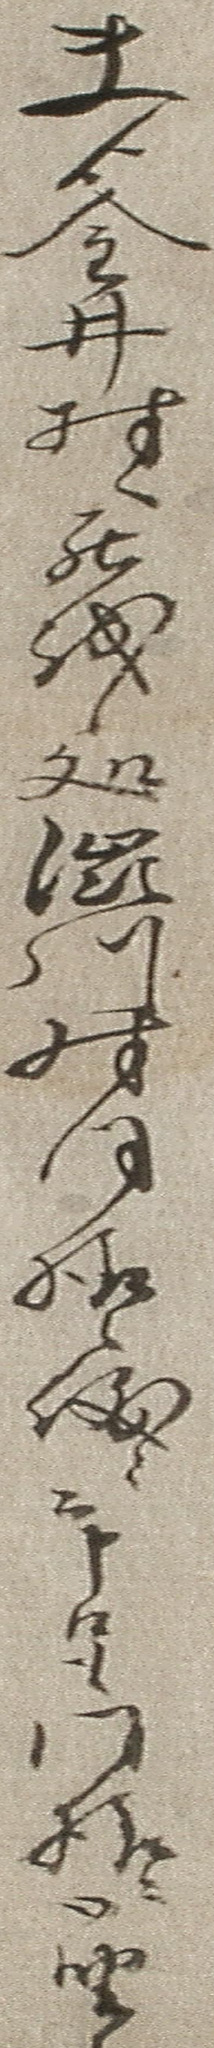夫ゟ金井村へ罷越候処渋川村同様之儀に而申候も同様に御座候
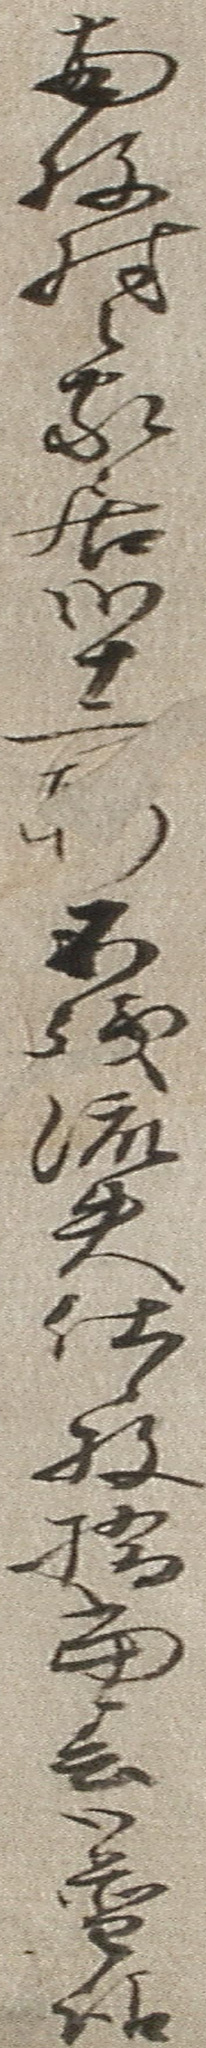南牧村之家居弐十二軒不残流失仕候牧橋当春御普請
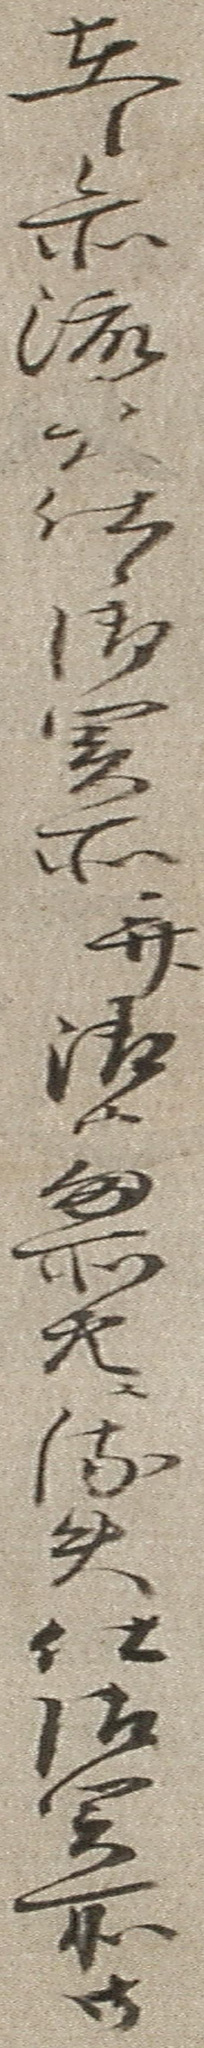在之候所流失仕候御関所并御番所共に流失仕御関所御
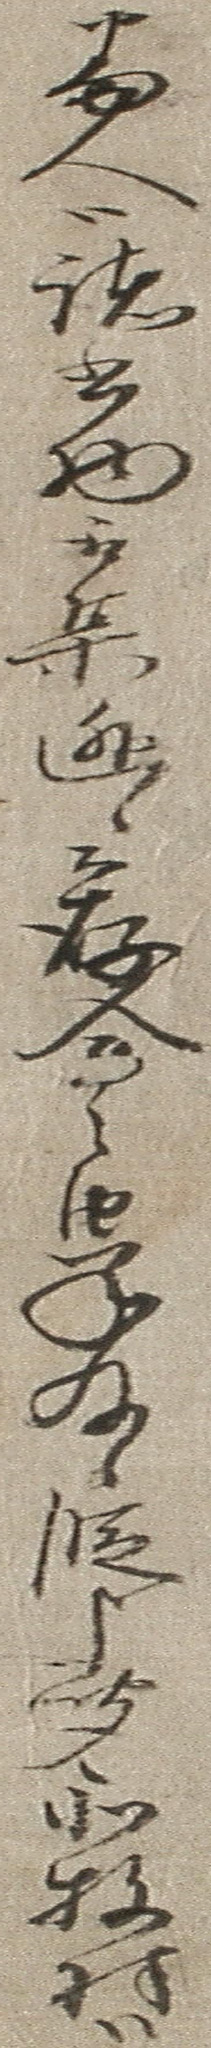番人は諸書物取集逃候而存命之由承右候段申聞候北牧村は
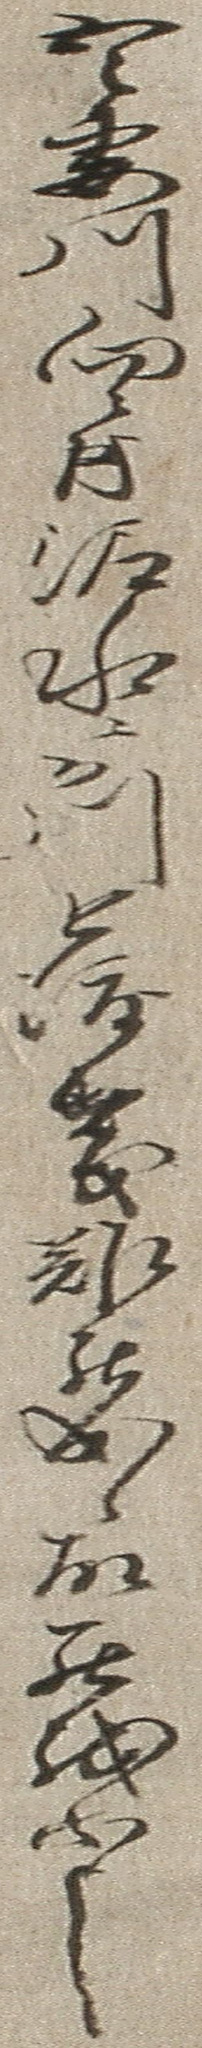吾妻川向に付泥水に而川を渡候義難罷成候故罷越不申候
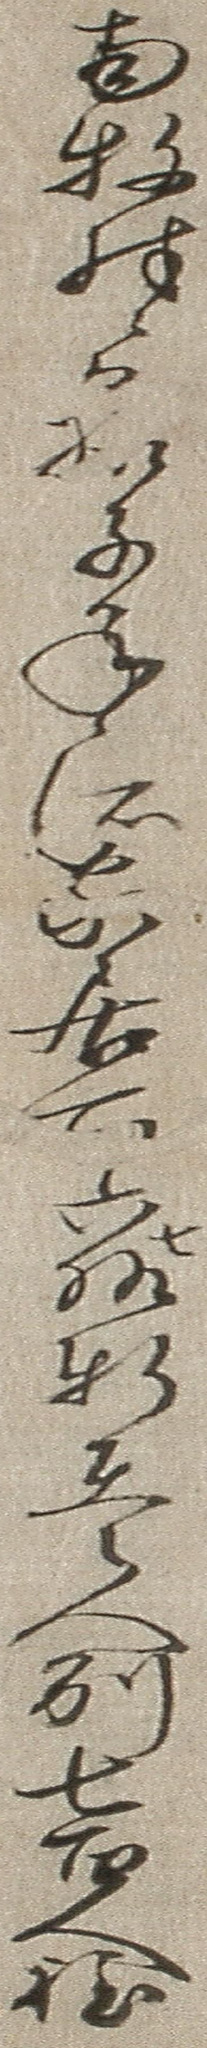南牧村に而様子承候所家居百六七拾軒在之人別七百人程も
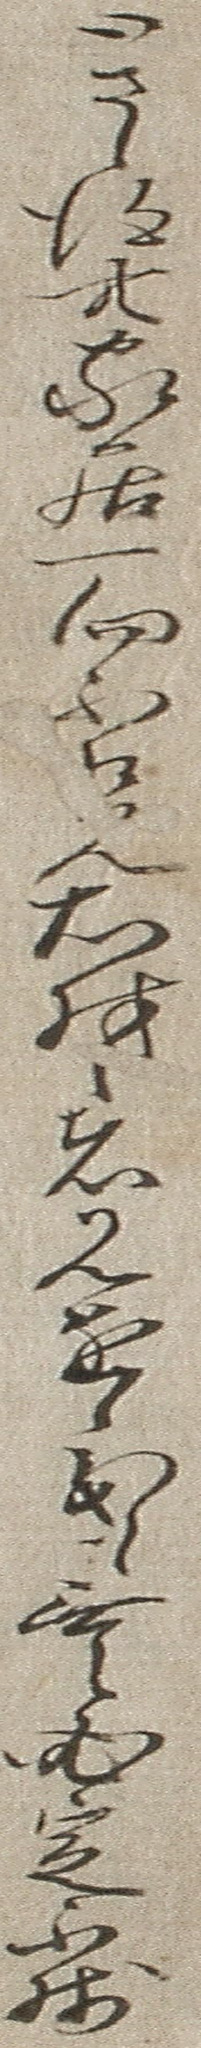御さ候得共家居一向不相見右村之者見懸候義も無之必定不残
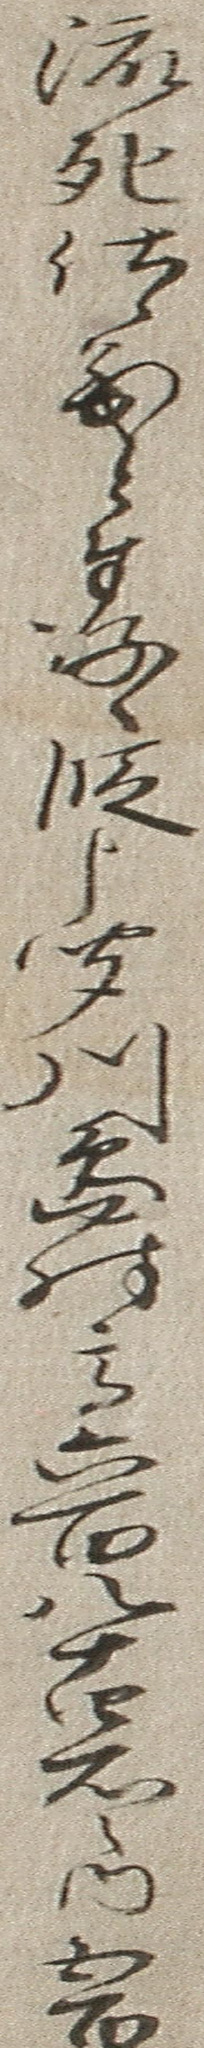流死仕候義と奉存候段申聞川島村高六百八十四石之内五百
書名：太平秘録抜書　浅間山燒及普賢山崩
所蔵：東京大学地震研究所図書室 Earthquake Research Institute Library, The University of Tokyo, JAPAN
